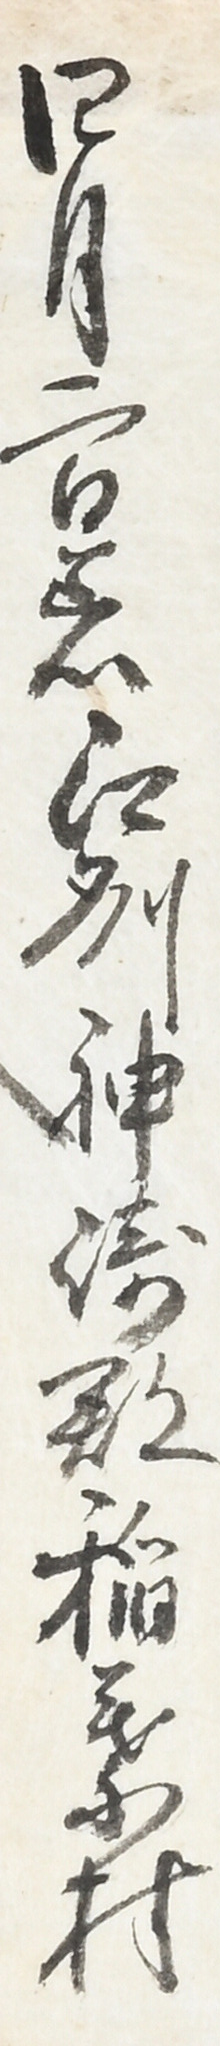四月二日着江州神崎郡稲葉村
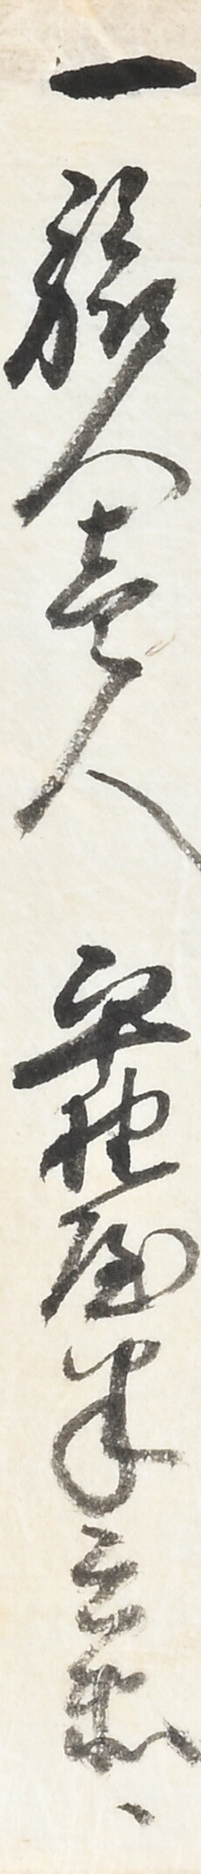一旅人壱人平野屋半兵衛・

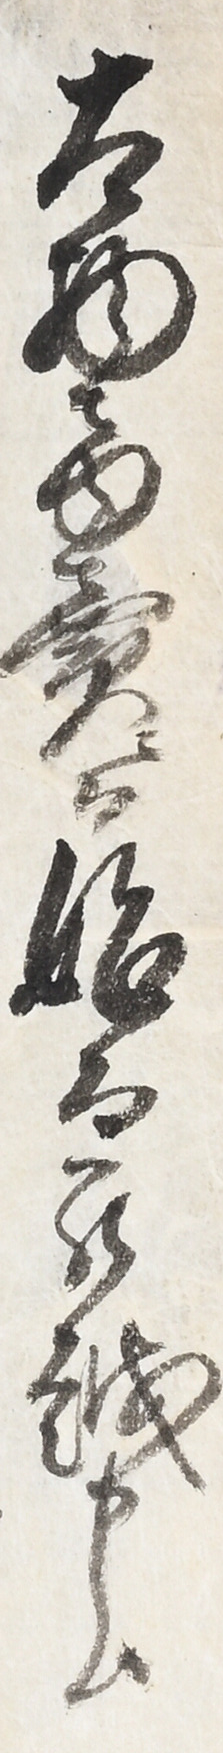太物商売ニ而始而罷越申候
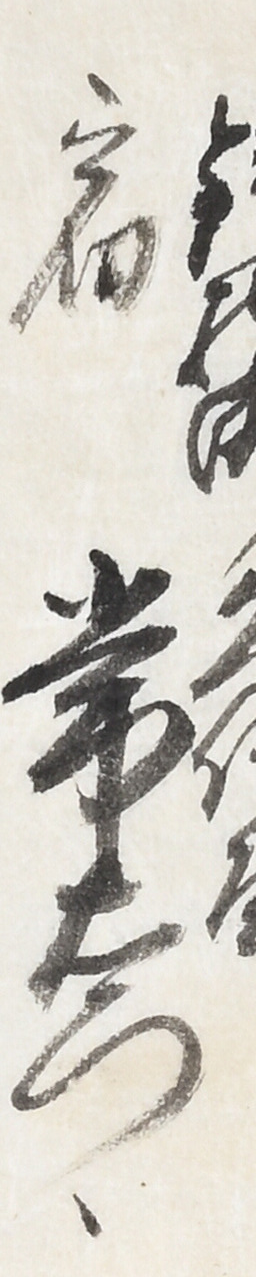宿常右衛門
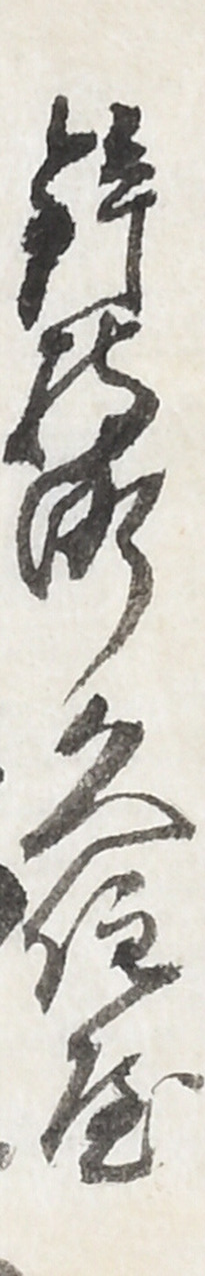鉾持町久住屋
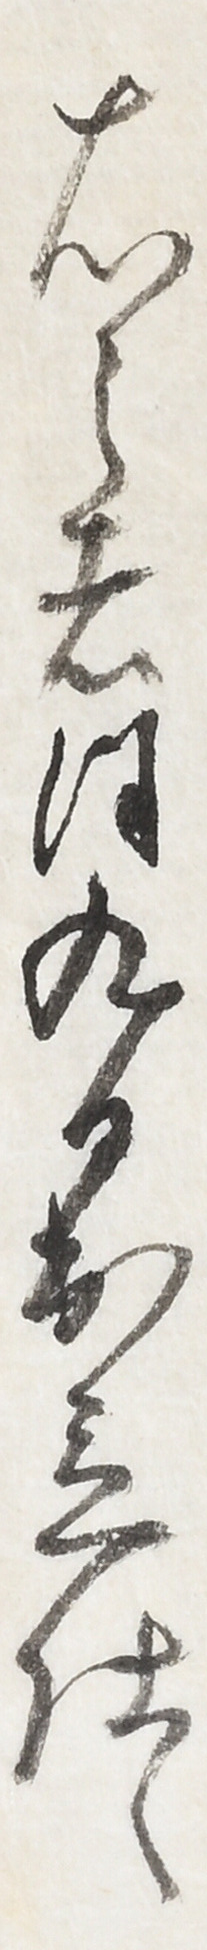右之者同九日出立仕候
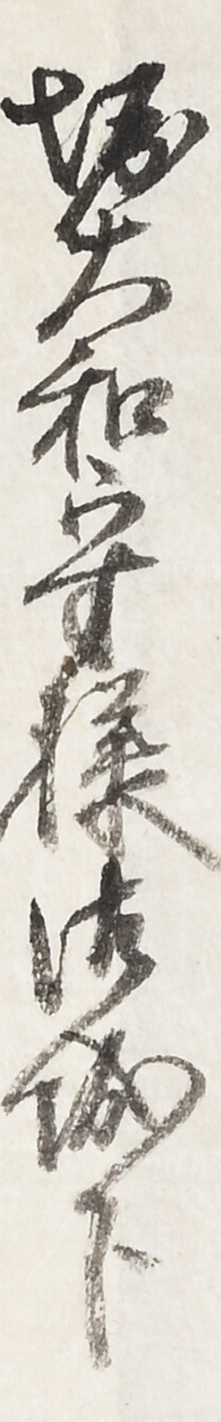堀大和守様御城下
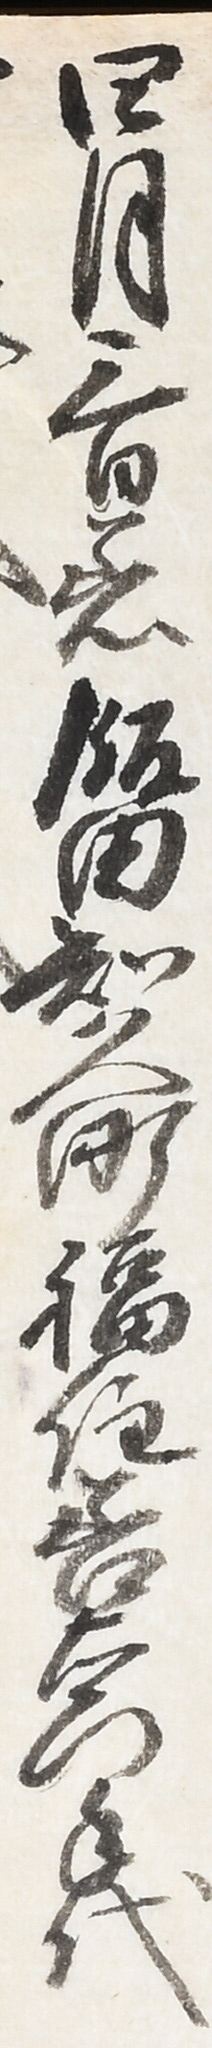四月三日着飯田知久町福住善右衛門手代
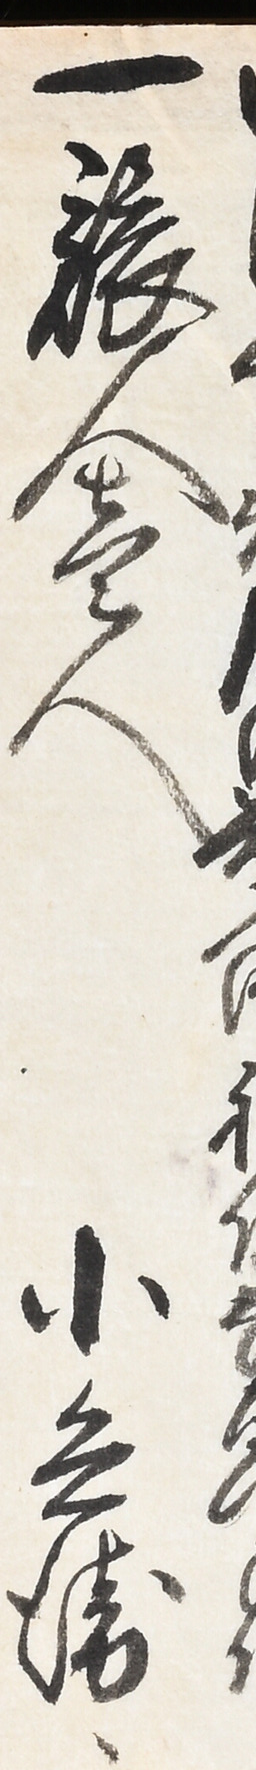一旅人壱人小兵衛
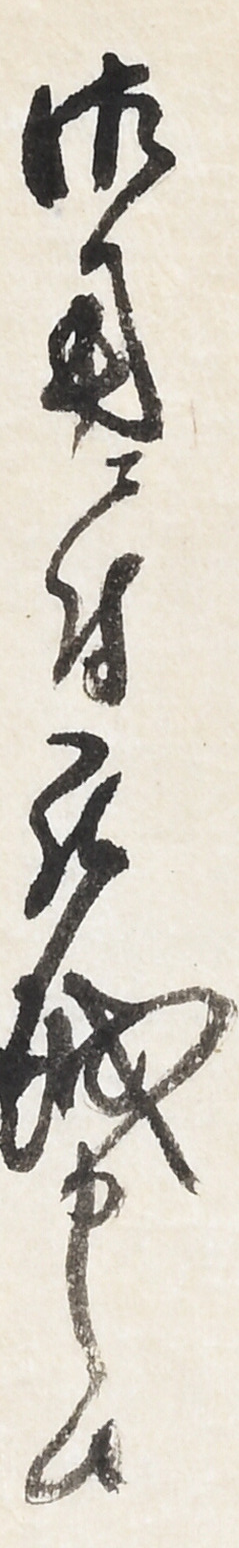御用ニ付罷越申候
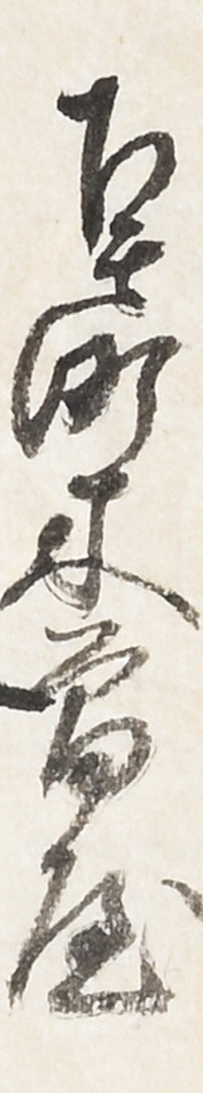下モ町木曽屋
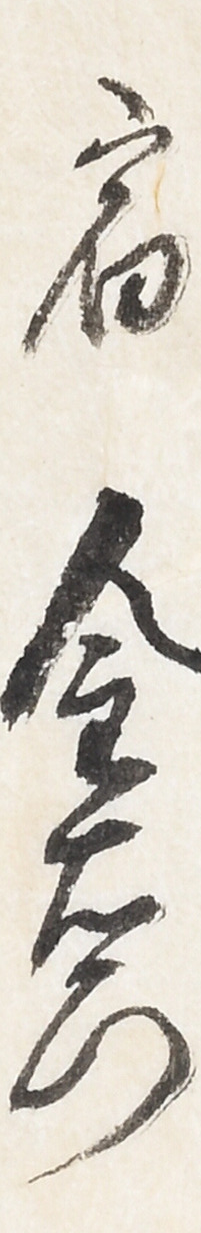宿金右衛門
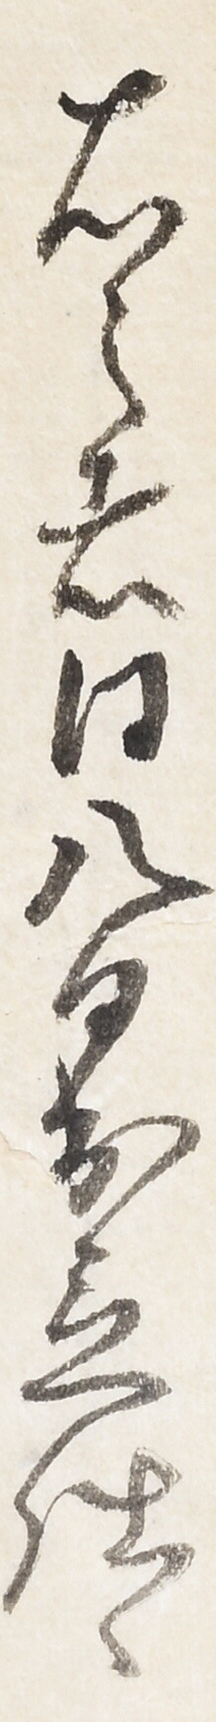右之者同八日出立仕候
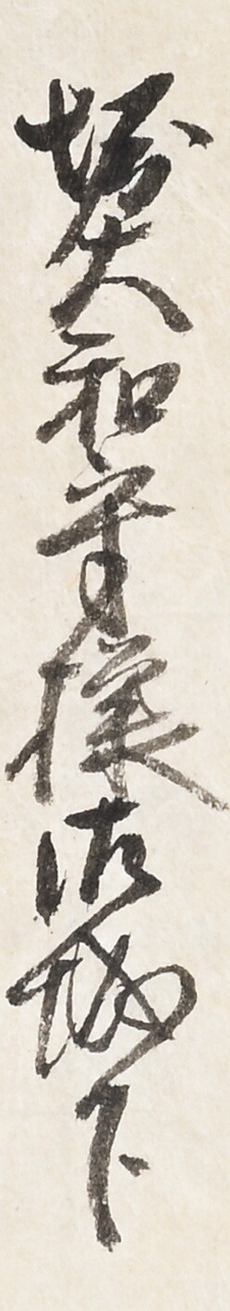堀大和守様御城下
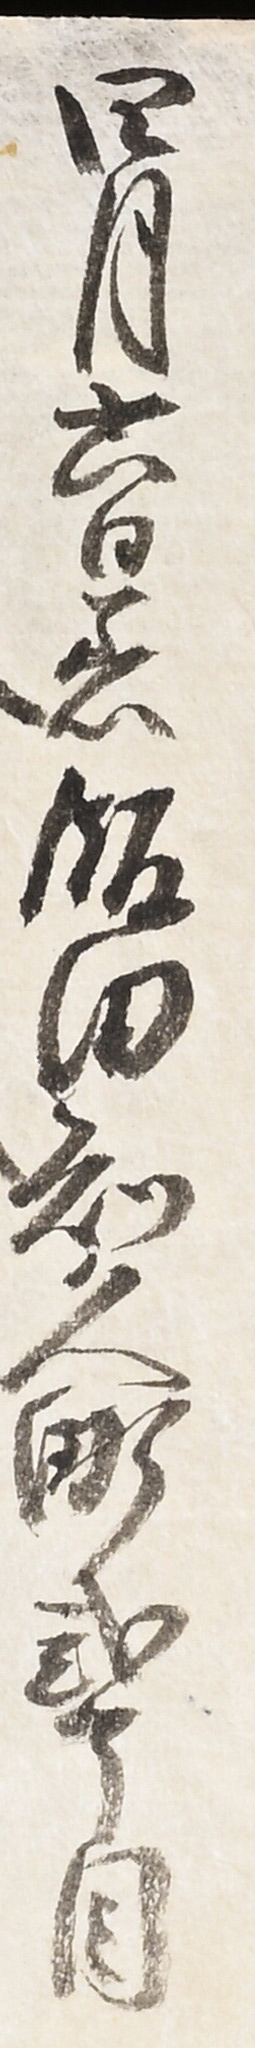四月六日着飯田知久町弐丁目
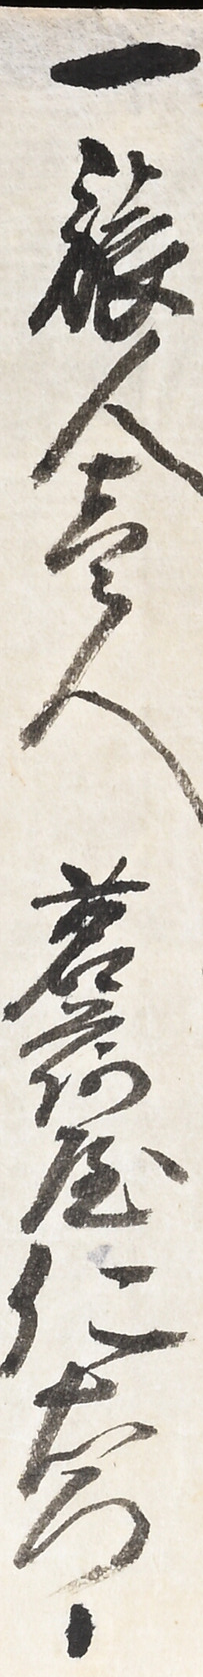一旅人壱人茗荷屋仁右衛門・
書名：旅人泊控帳
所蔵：伊那市立高遠町図書館・合同会社AMANE
